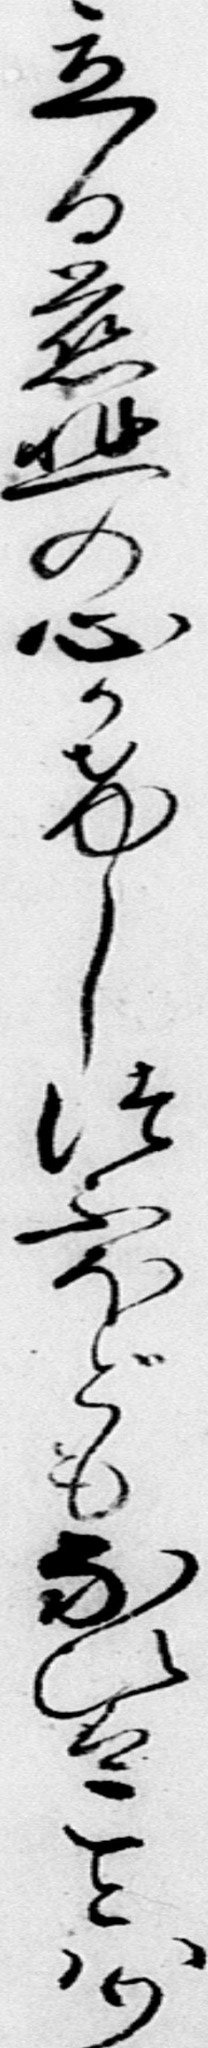立る慈悲の心かけしつふほどもなひはことはり
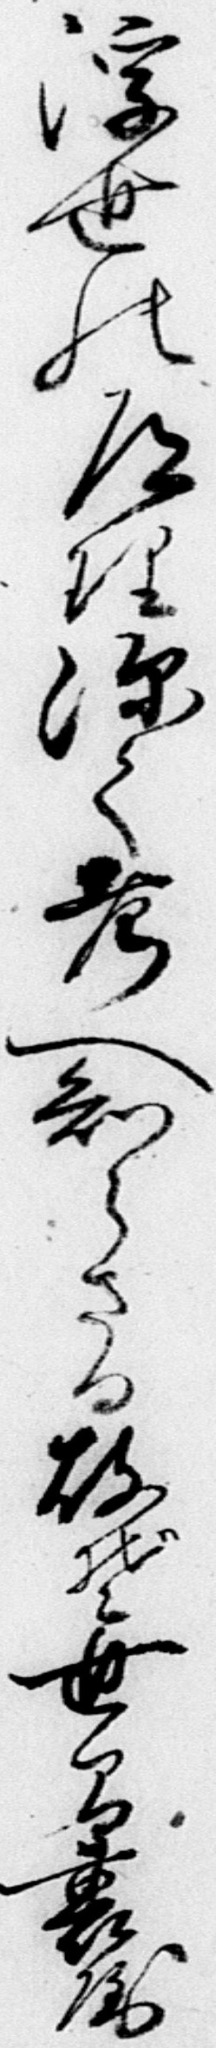浮世の道理深く考へ知らさる故ぞ世間裏屋
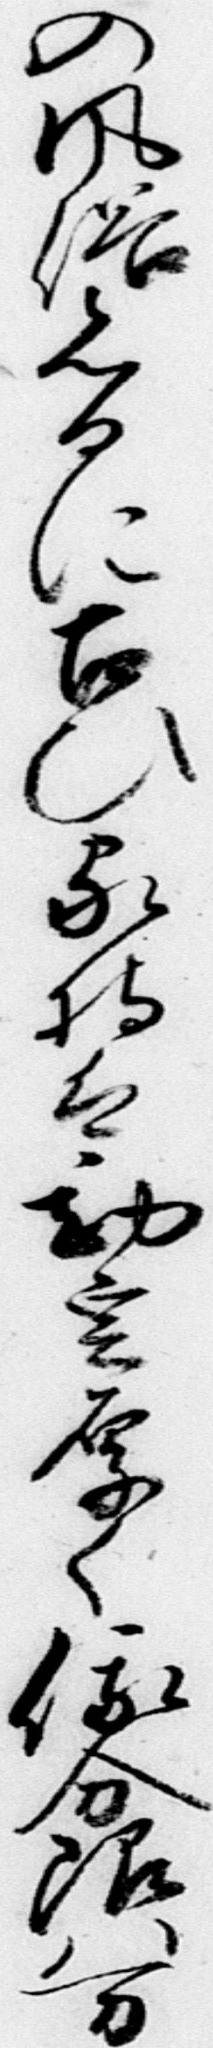の風俗見るに古ひ家持勘定厚く俄分限は万
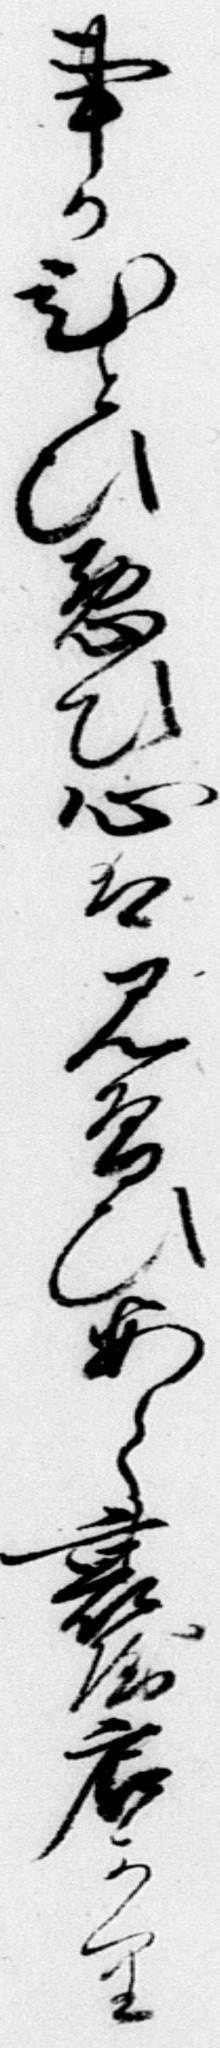事かひとひ悪ひ心は見習ひ安く裏屋店かり
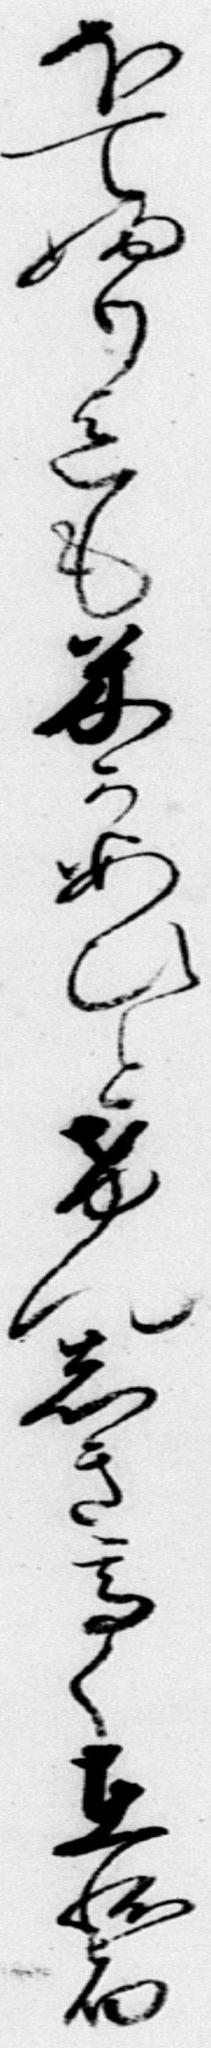ほてふり迄も米か安ひとけんしき高く在所者
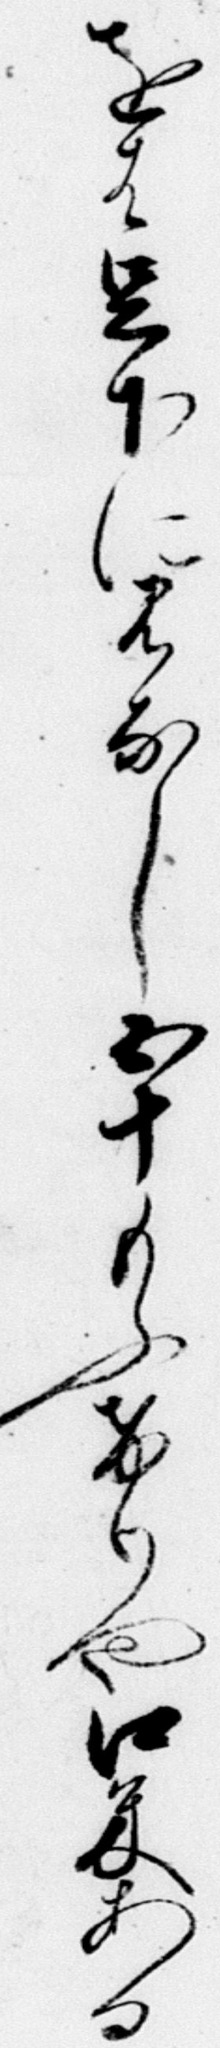をは足下に見なし五十もふけりや口米ある
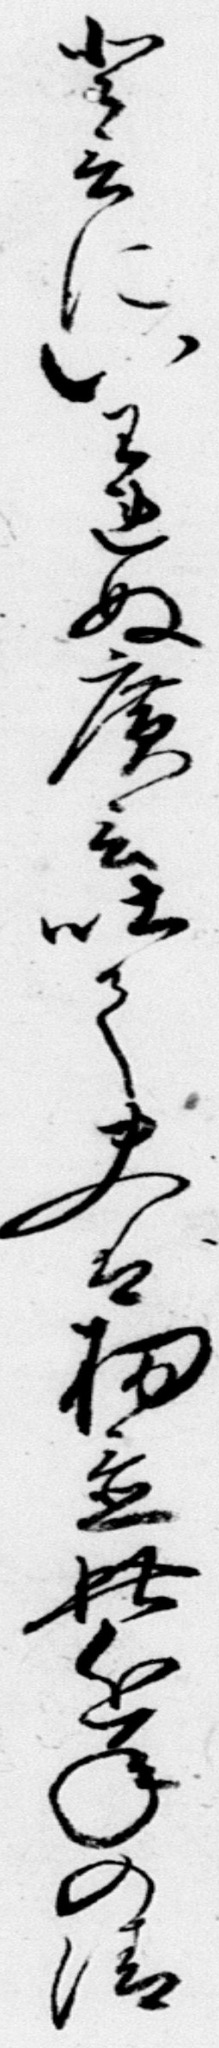と言にいわれぬ広言吐て夫は扨置此近年の清
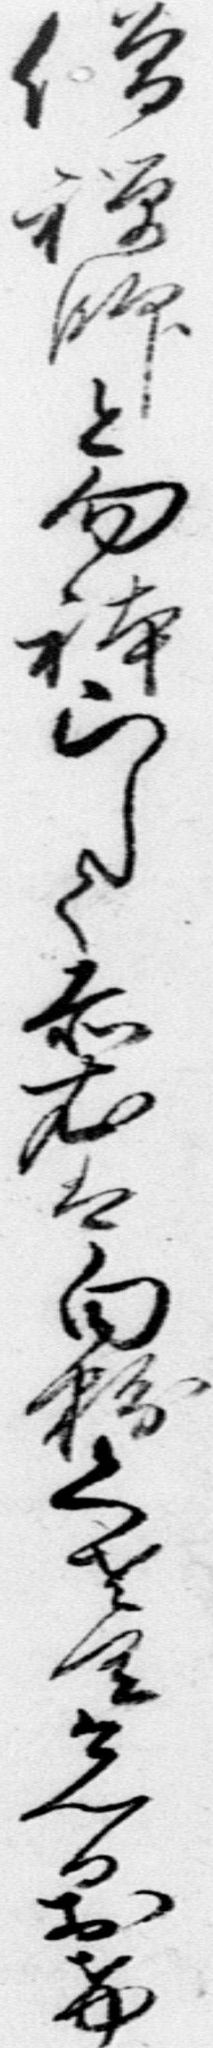僧禅師と勿体らしく忝无は白粉くさりそへるおけ
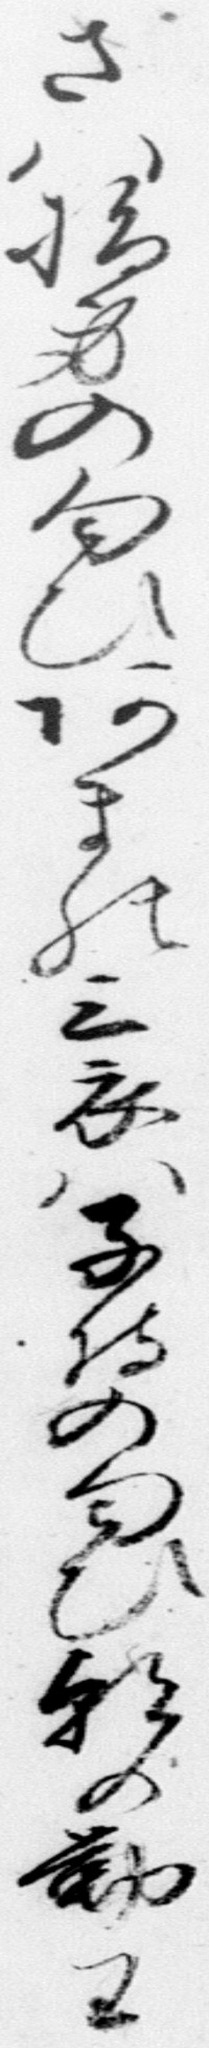さは指身の匂ひあまの三衣は子持の匂ひ朝の勤わ
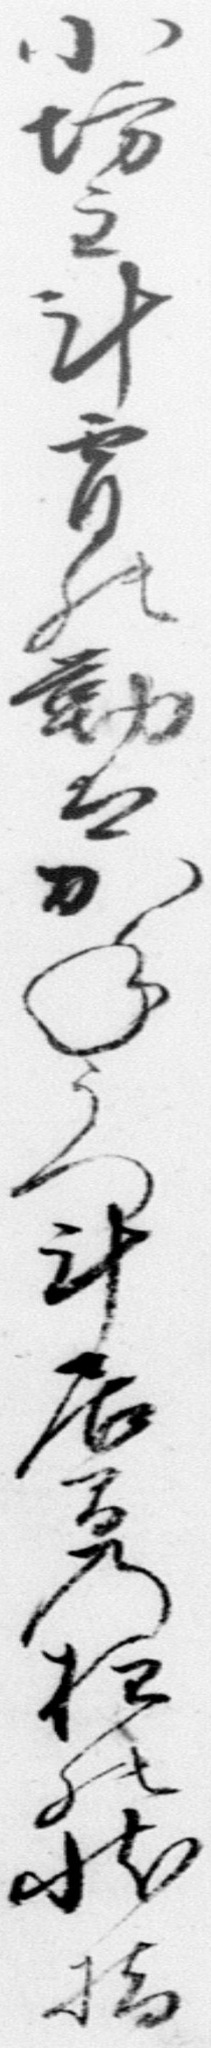小坊主計宵の勤はかねうつ計居間の柱の状指
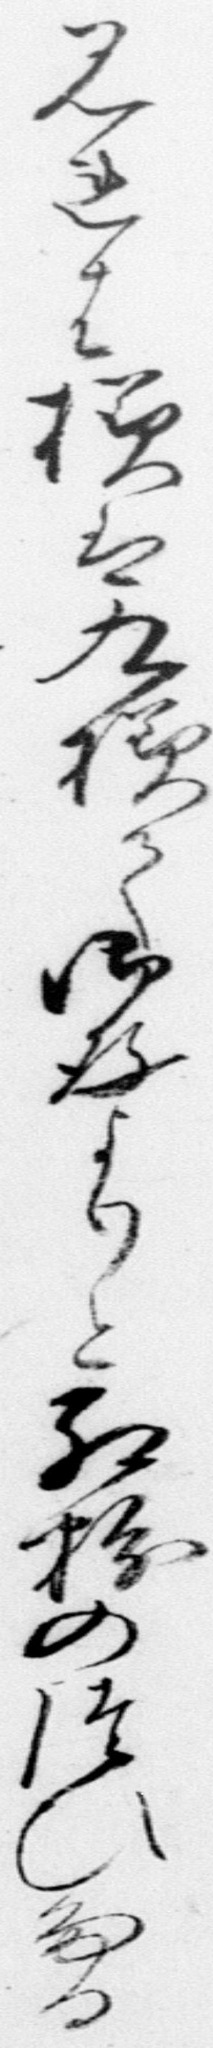見れは様は九様て御存よりと紅粉のつひたる
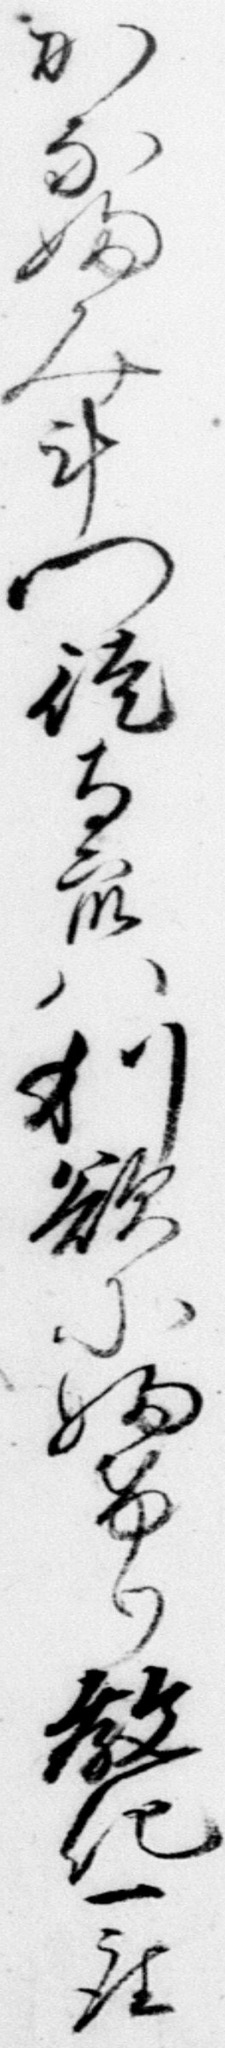かなふみ計門徒寺衆は利欲にふけり教化一座
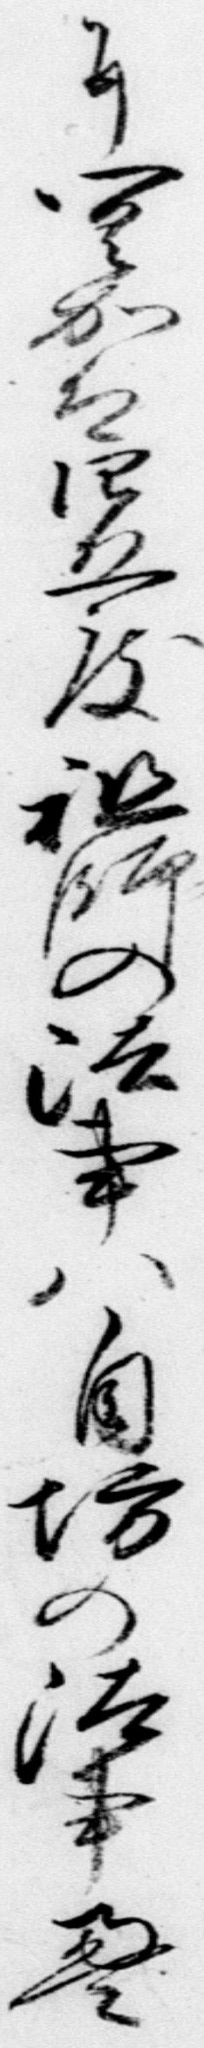に冥加は四五度祖師の法事は自坊の法事畳
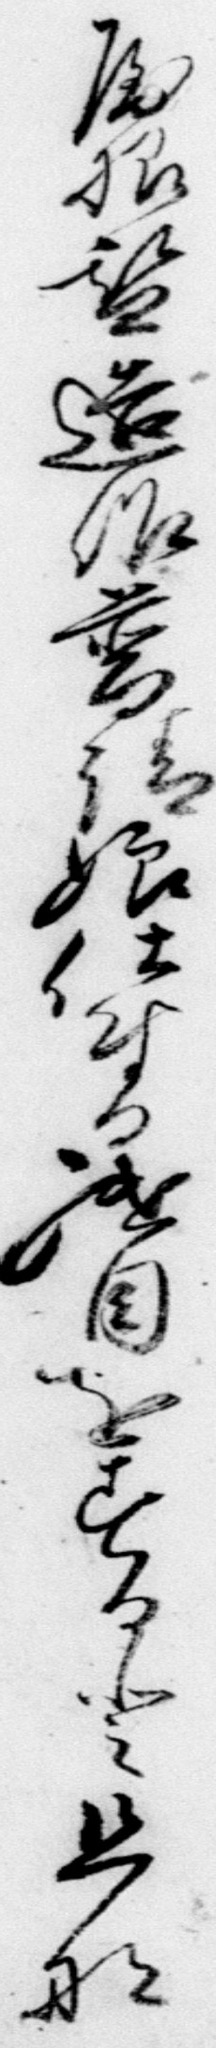屋根替造作普請娘仕付る継目をすると旦那

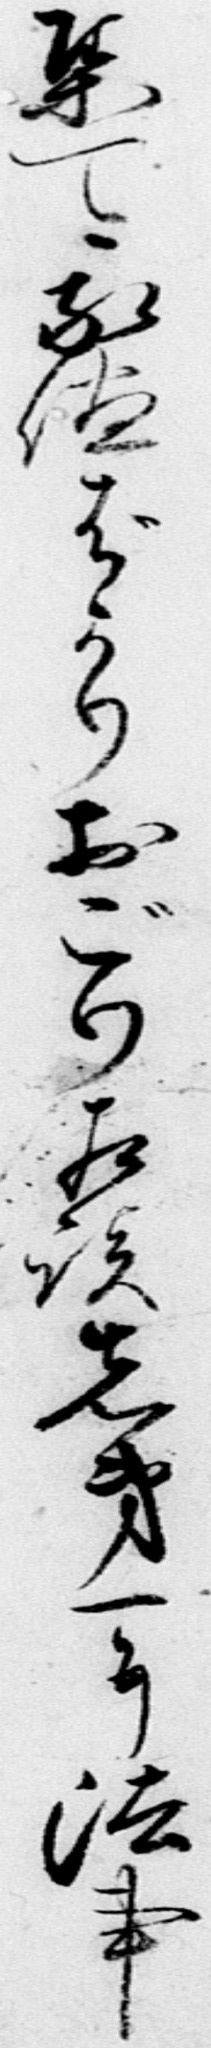集て我儘ばかりおごり相談先第一に法事
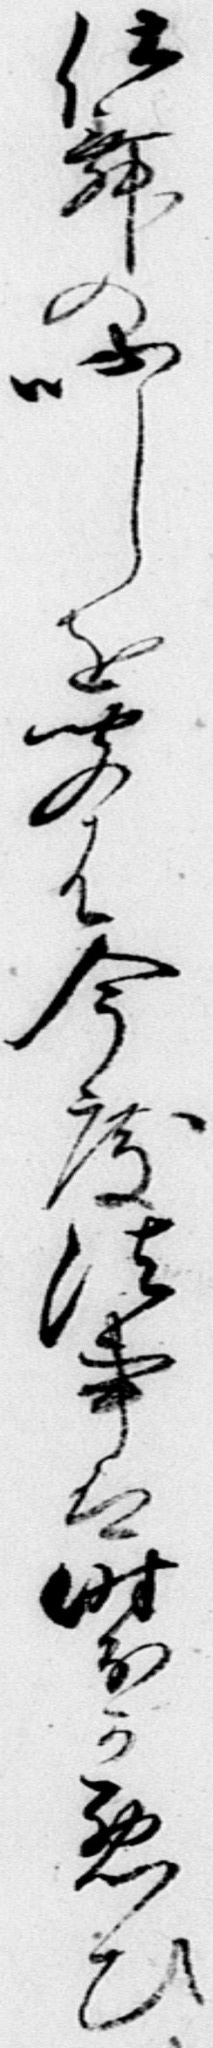仕舞の咄しを聞は今度法事は時分か悪ひ
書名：越後地震由来
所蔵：徳島県立図書館
